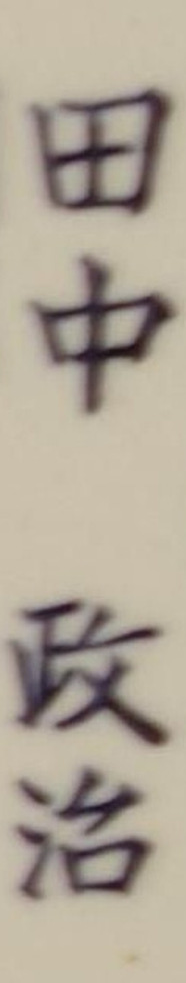田中政治
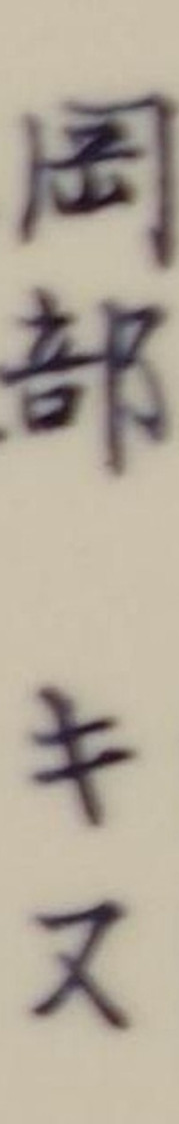岡部キヌ
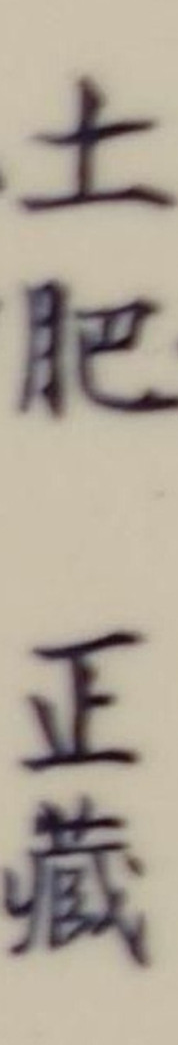土肥正蔵
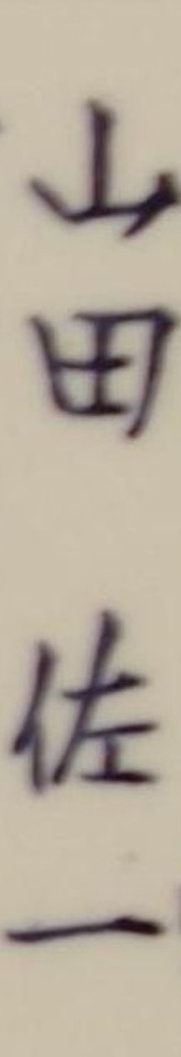山田佐一
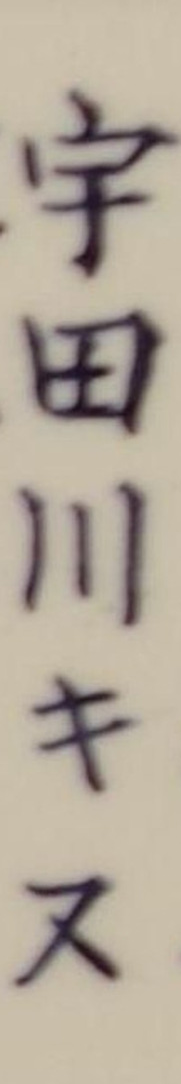宇田川キヌ
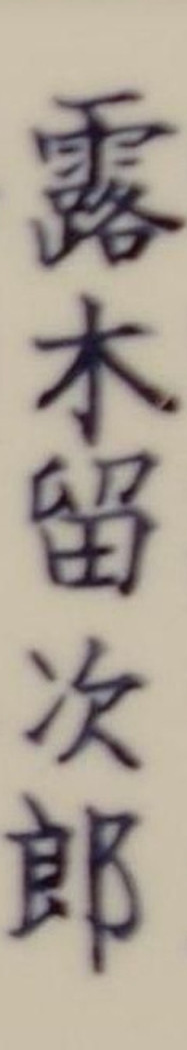露木留次郎
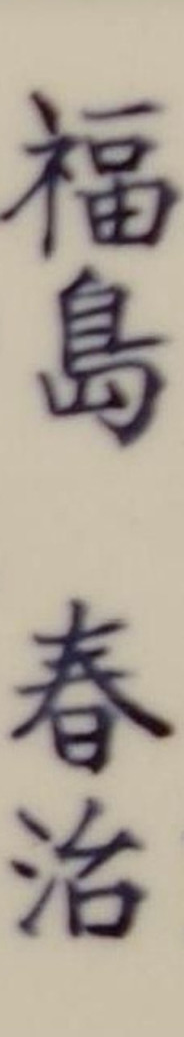福島春治
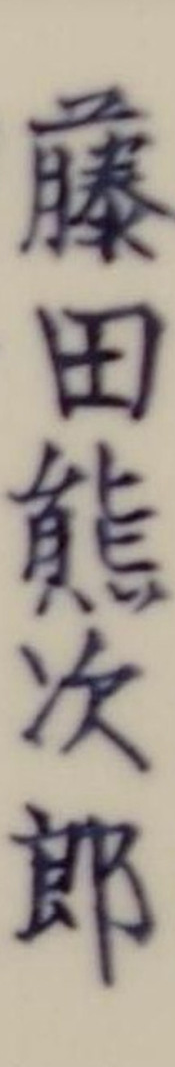藤田熊次郎
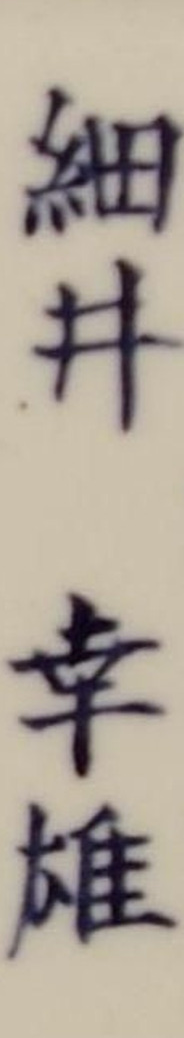細井幸雄
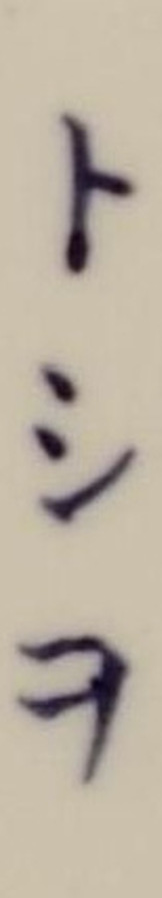トシヲ
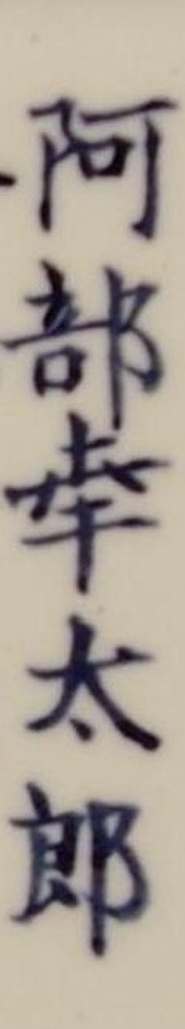阿部幸太郎
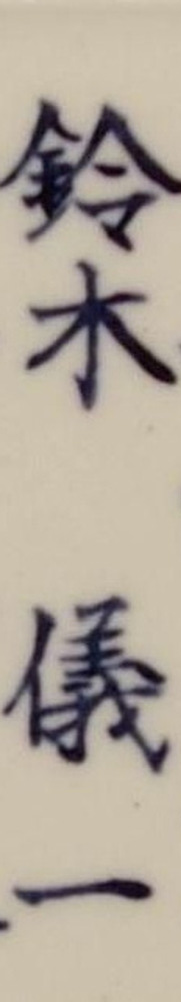鈴木儀一
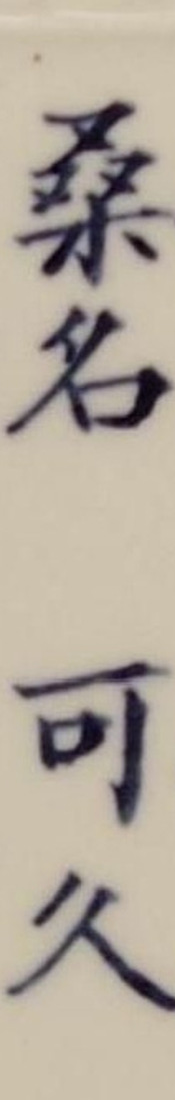桑名可久
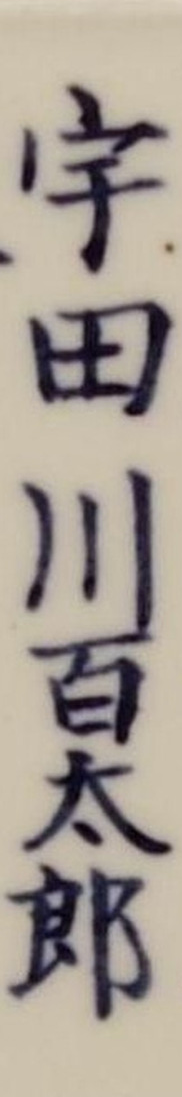宇田川百太郎
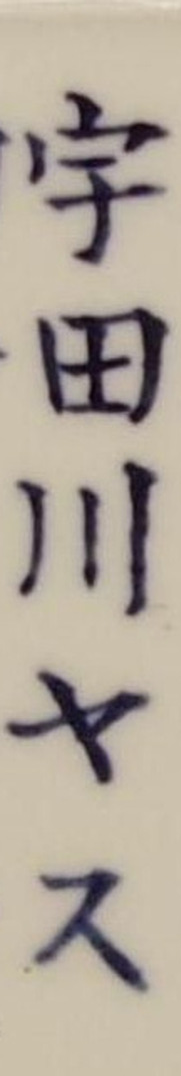宇田川ヤス
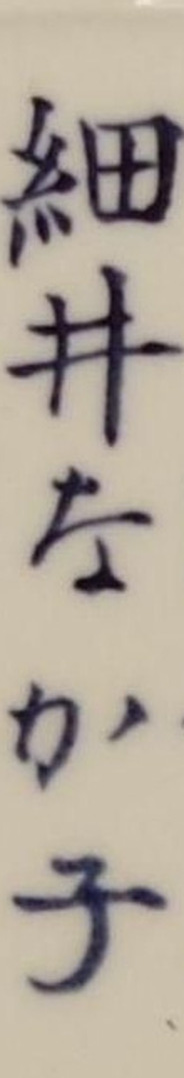細井なか子
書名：M~S
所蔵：高野山金剛峯寺
